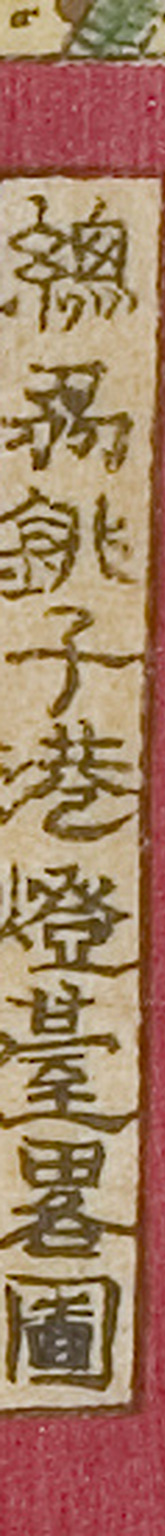総州銚子港燈台略図
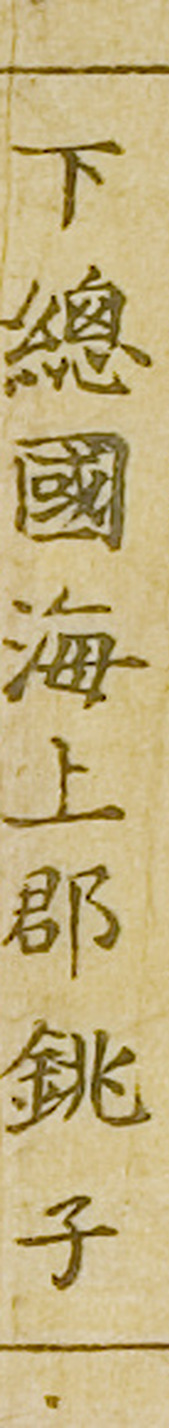下総国海上郡銚子
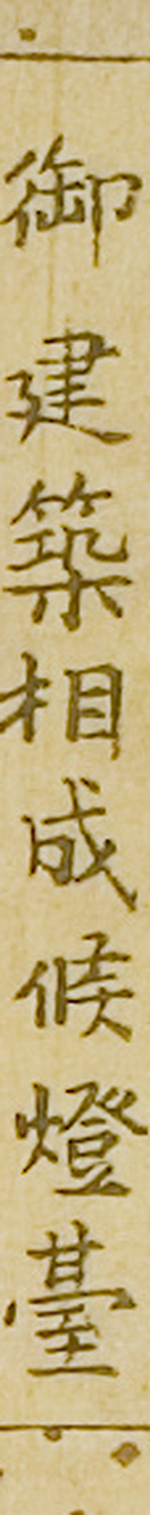御建築相成候燈台
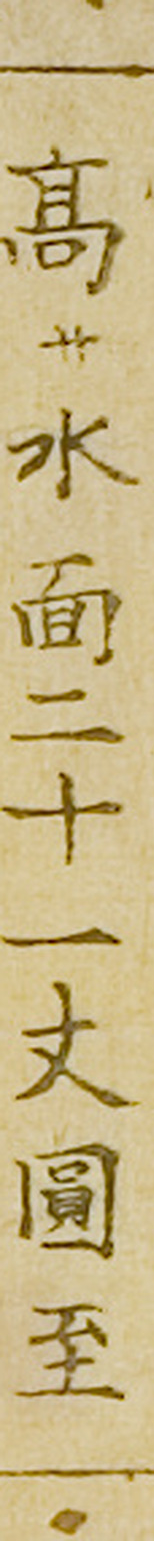高サ水面二十一丈円至
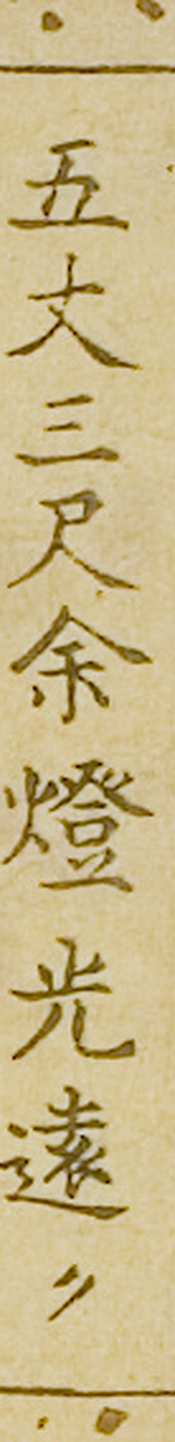五丈三尺余燈光遠ク
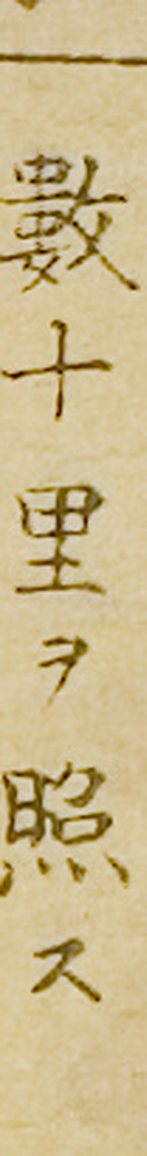数十里ヲ照ス
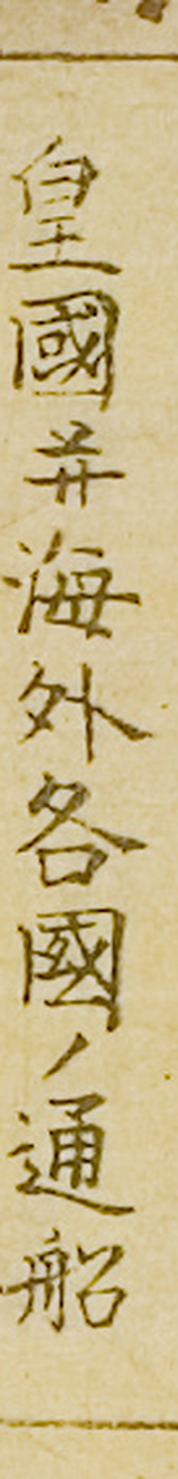皇国并海外各国ノ通船
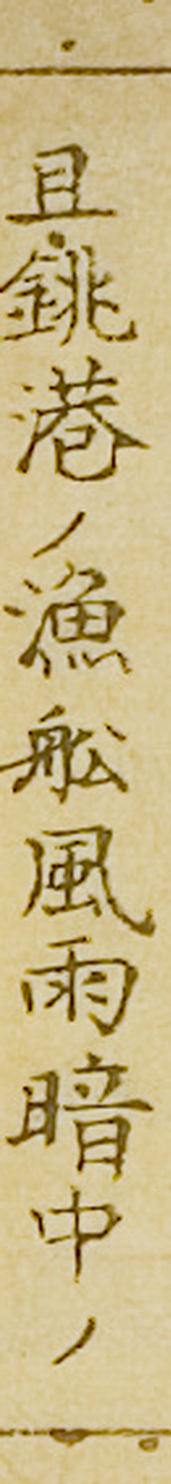且銚港ノ漁船風雨暗中ノ
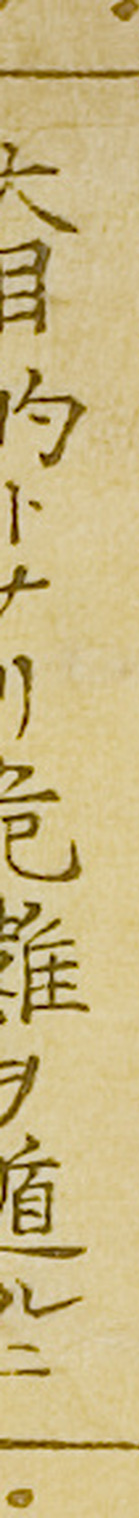大目的トナリ危難ヲ遁ルニ
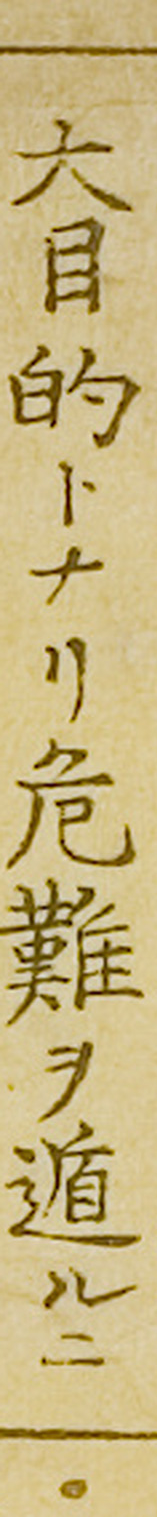大目的トナリ危難ヲ遁ルニ
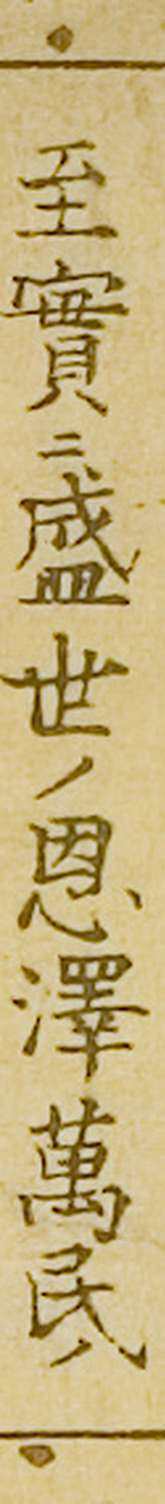至実に盛世ノ恩沢万民ノ
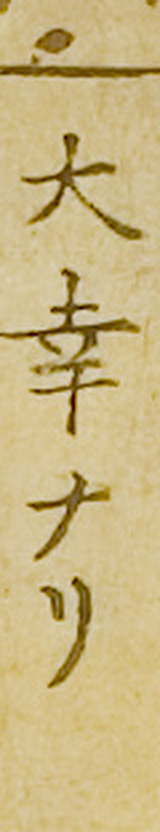大幸ナリ

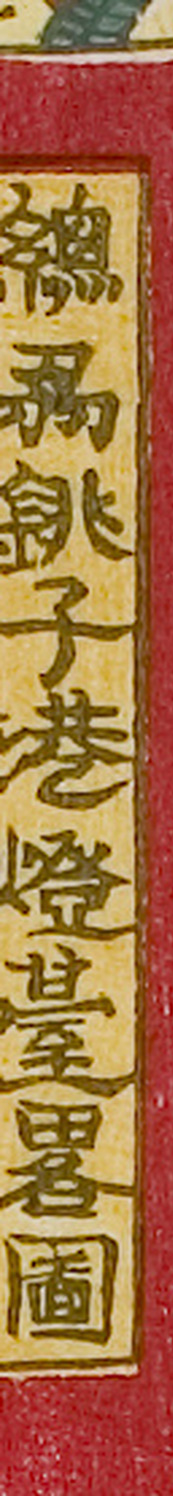総州銚子港燈台略図
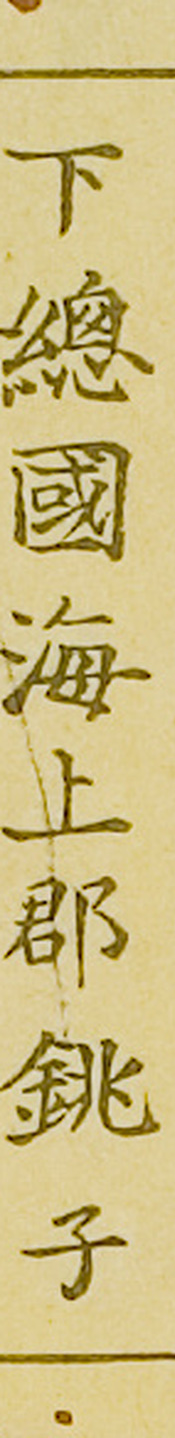下総国海上郡銚子
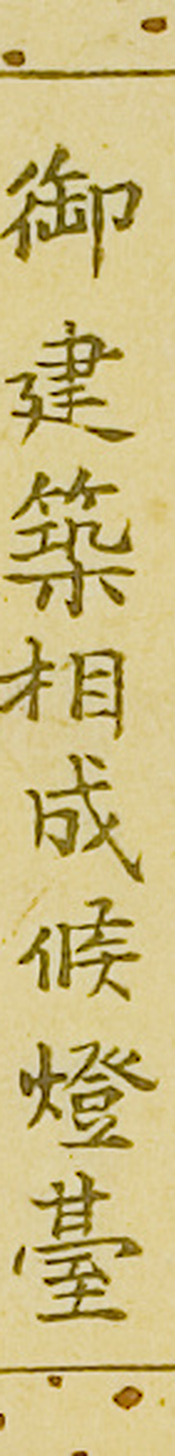御建築相成候燈台
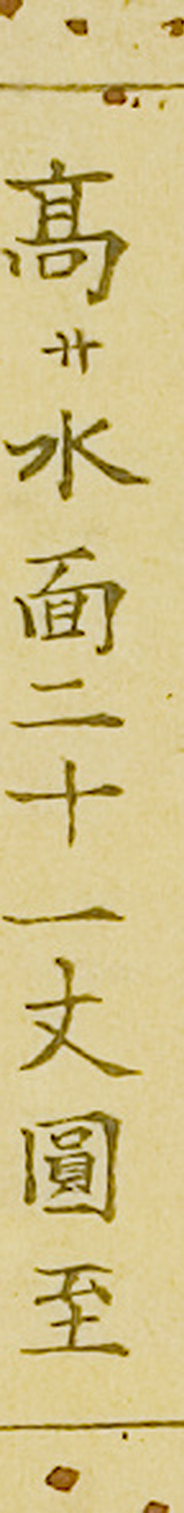高サ水面二十一丈円至
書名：総州銚子港燈台略図
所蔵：東京大学総合図書館 General Library in the University of Tokyo, JAPAN
